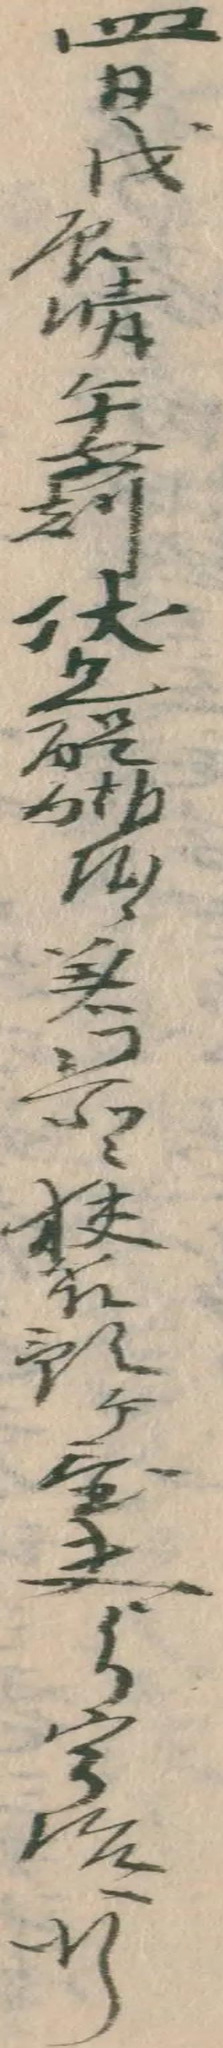四日戊辰晴午前刻伏見醍醐屋ヘ着同所に挟箱預ケ置夫より宇治へ行
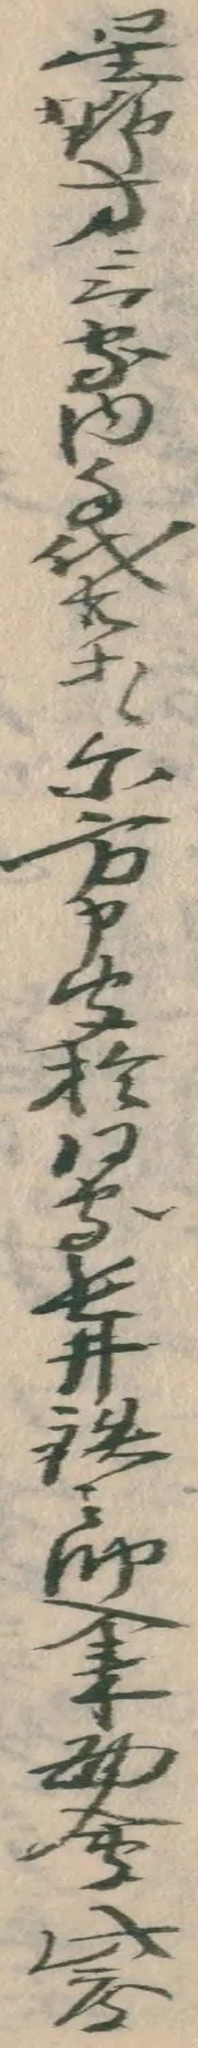星野方ニ而家内手代共等へ示方申聞於同處長井鉄之助入来面會此度
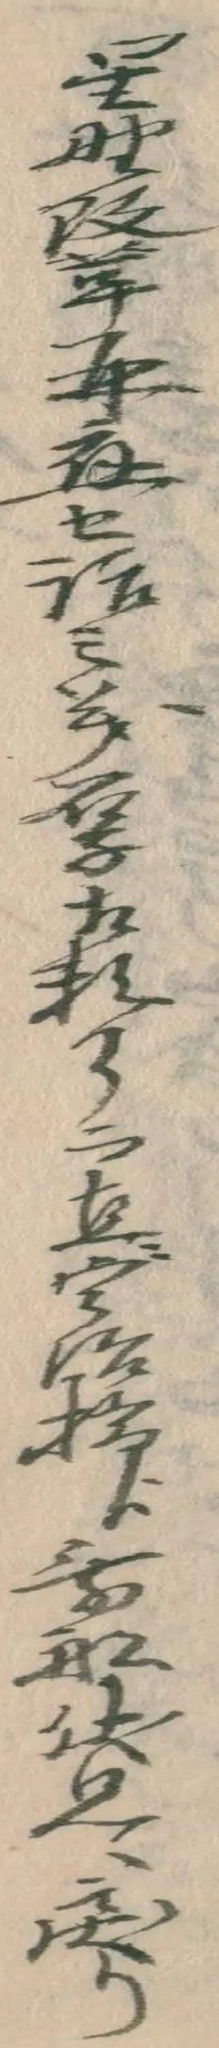星野改革再應世話之義厚相頼了而直ニ宇治橋ゟ乗舩伏見へ戻り
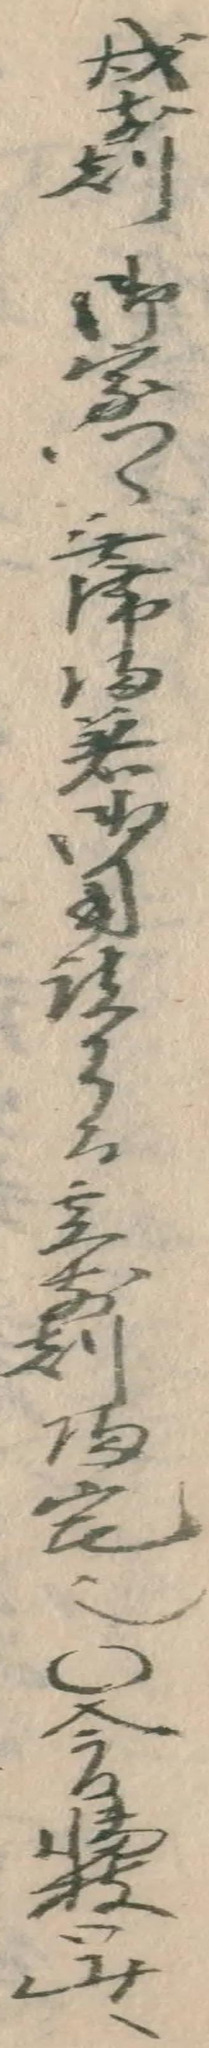戌前刻御家門へ無滞帰若御用諸了而亥前刻帰宅也○今日幡枝御山へ
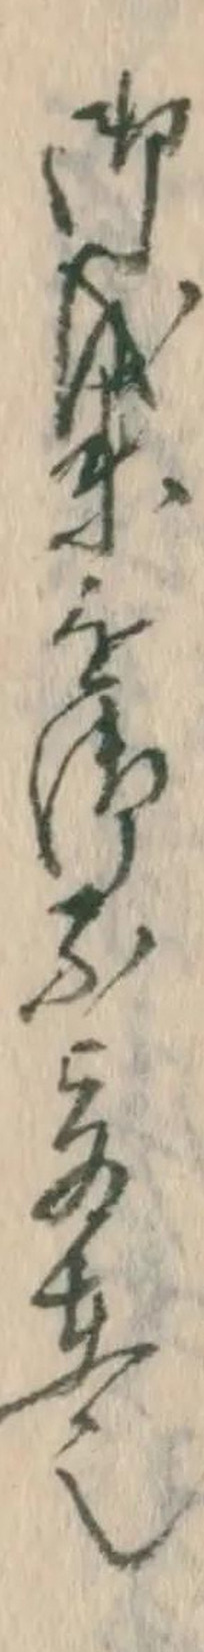御成未近不被為在也
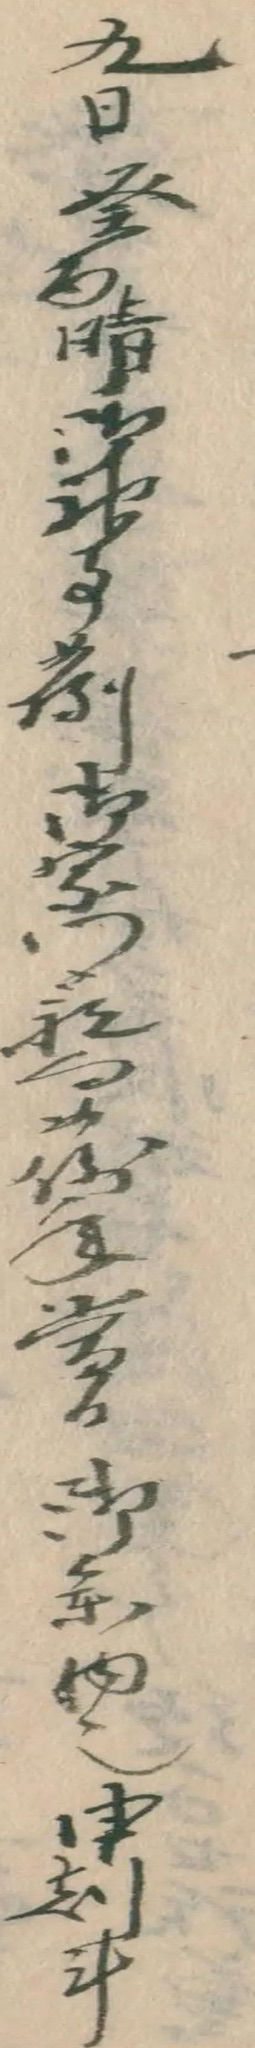九日癸酉晴御神事如例御家門御祝向如例年當日御参内也申刻斗
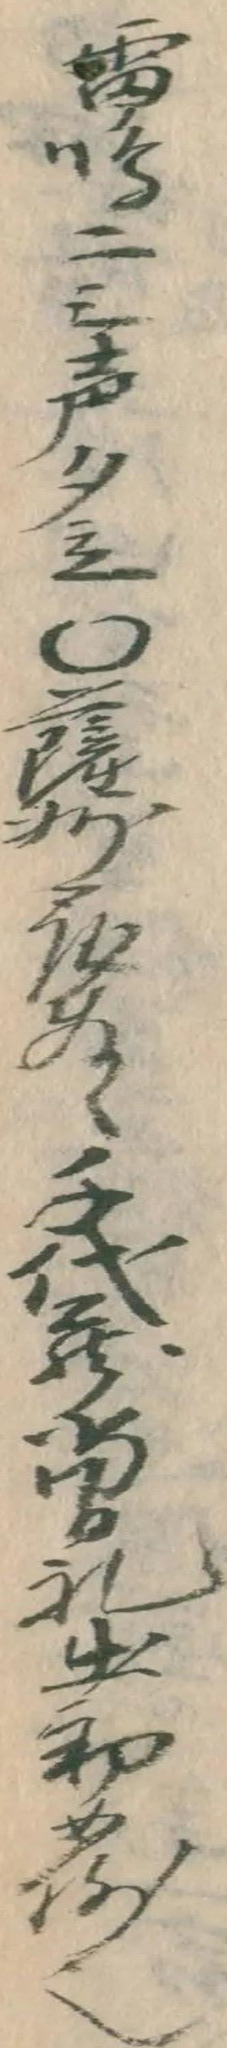雷鳴ニ三声夕立○薩州屋敷へ手代蔵當日礼出勤如例也

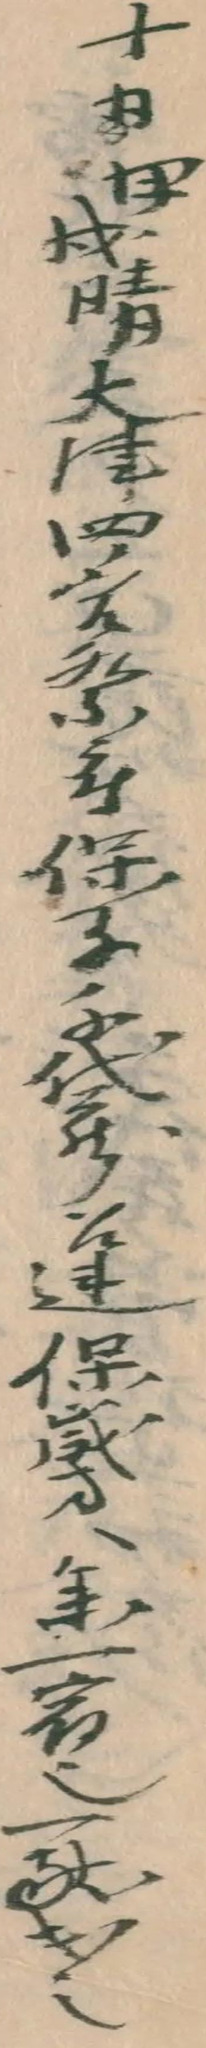十日甲戌晴大津四宮祭ニ付保子千代蔵召連保威方へ参一宿也一献出之
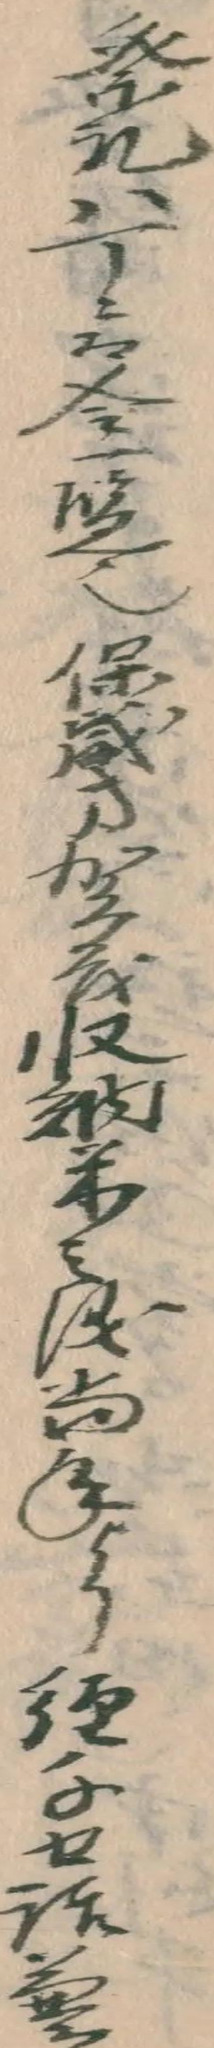祭礼八丁ニ而令覧也保威方賀茂快納米之銭當年より経千世話兼而
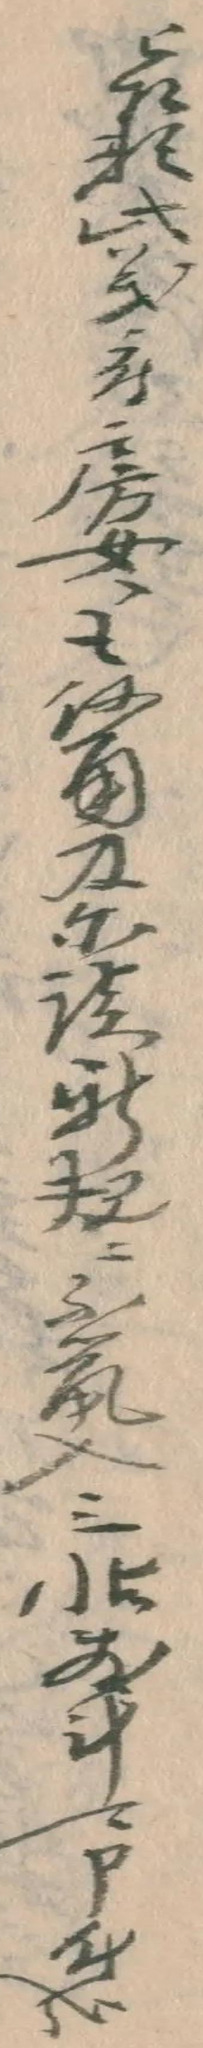被相頼此義ニ付房女へも仕角及示談新規ニ不届入三帖敷斗可申付哉
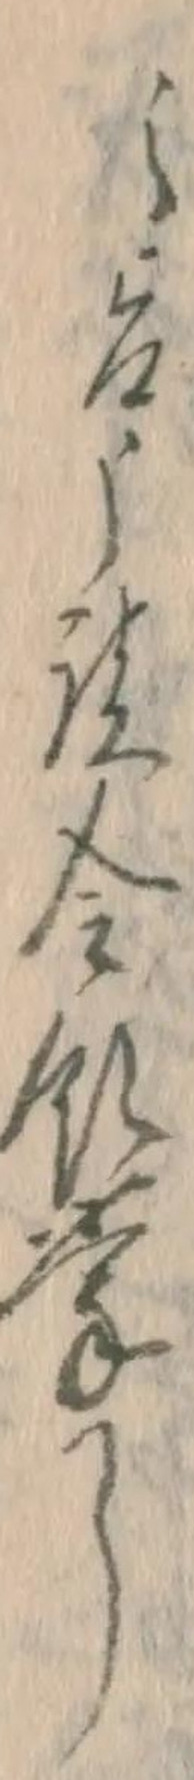之旨申請令領掌了
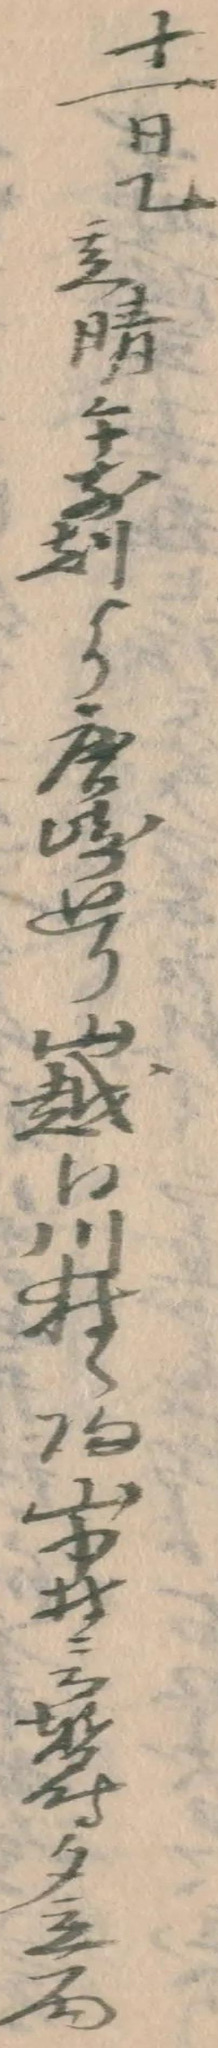十一日乙亥晴午前刻より唐崎廻り山白川村へ帰山中村に而暫時夕立雨
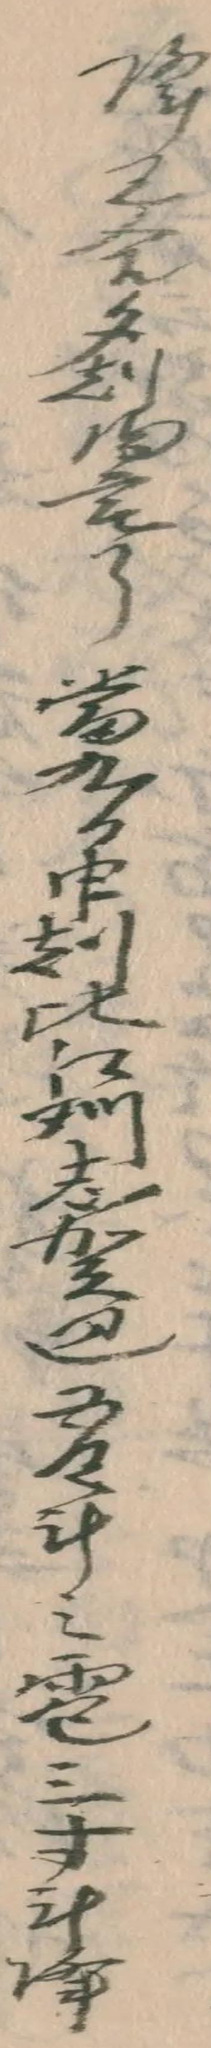降見合夕刻帰宅了當九日申刻比江州志賀辺五匁斗之雹三寸計降
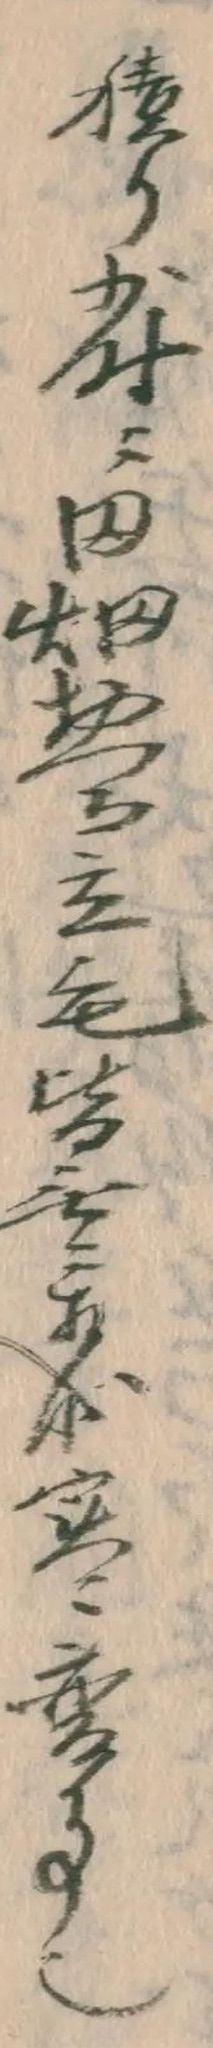積り少時二田畑惣而立毛皆無ニ相成実二変事也
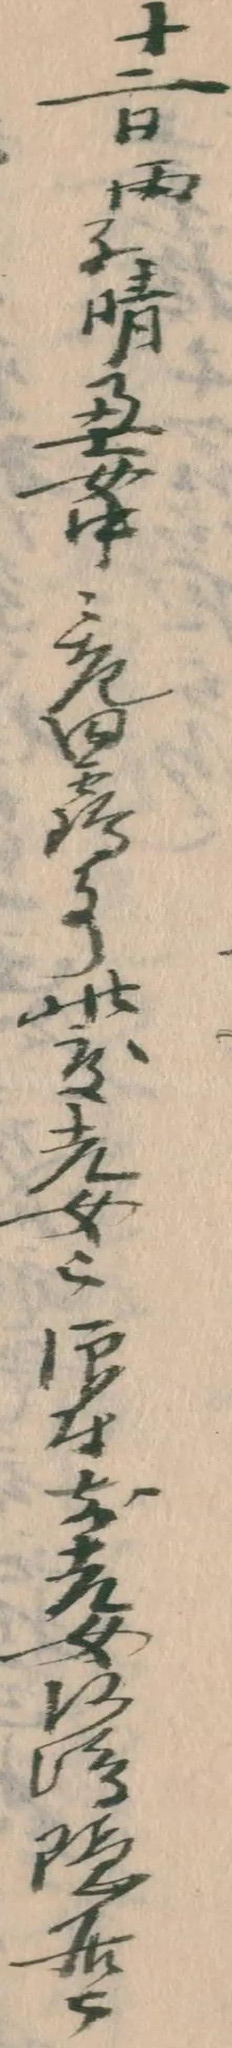十二日丙子晴奥女中ニ老田露事此度老女被仰付前老女以崎隠居被
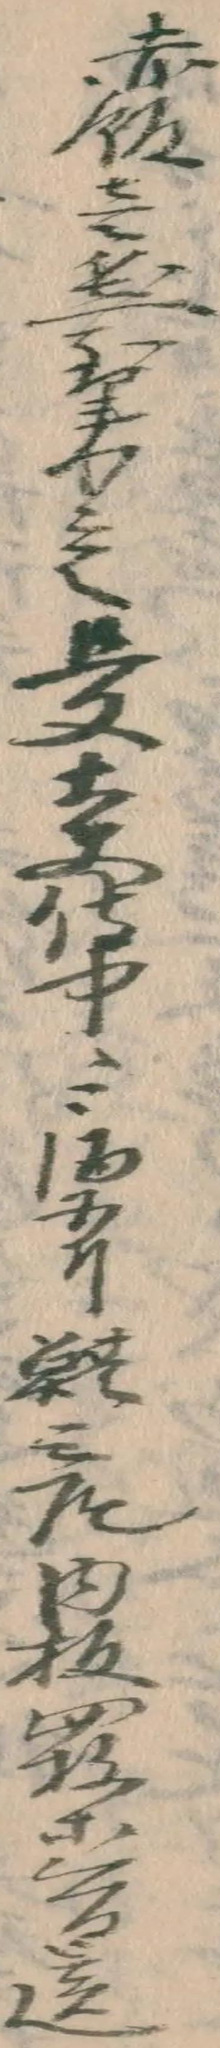赤飯壱器到来有之且又大夫侍中ヘハ酒五升鮭三尾内板四枚等今日送
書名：賀茂社記録. 第69冊
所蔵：国立国会図書館 National Diet Library, JAPAN
